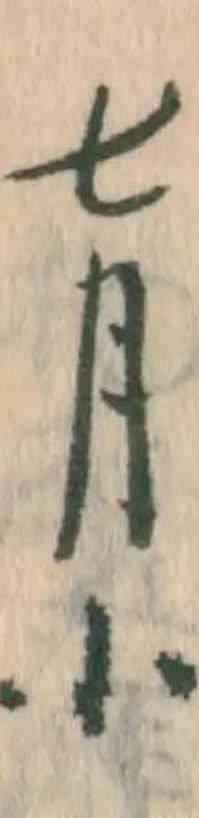七月小
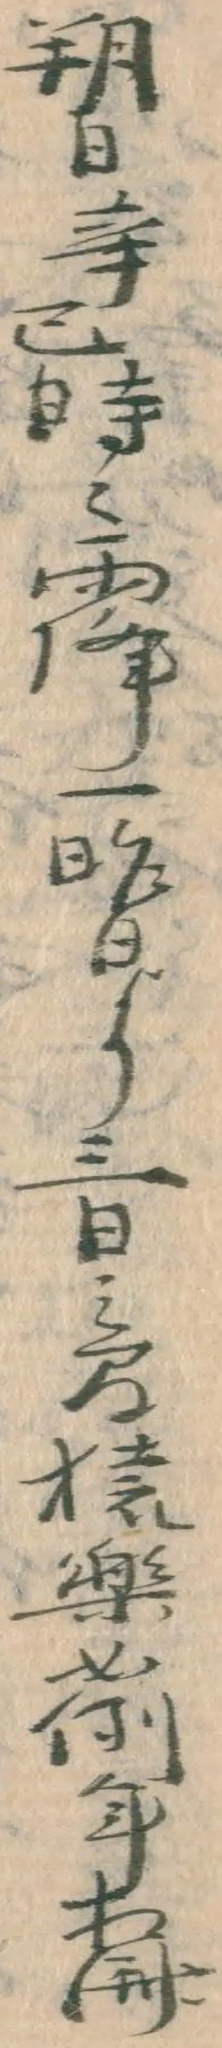朔日辛巳時々雨降一昨日より三日之間猿楽如例年相済
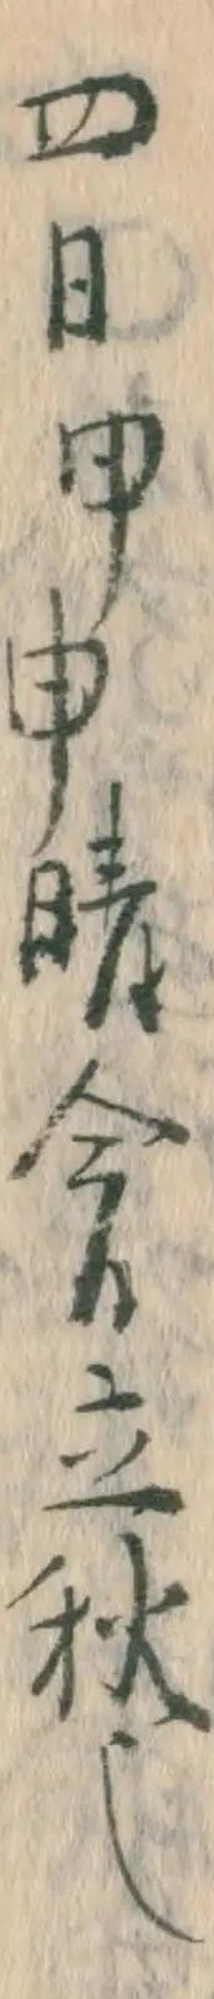四日甲申晴今日立秋也
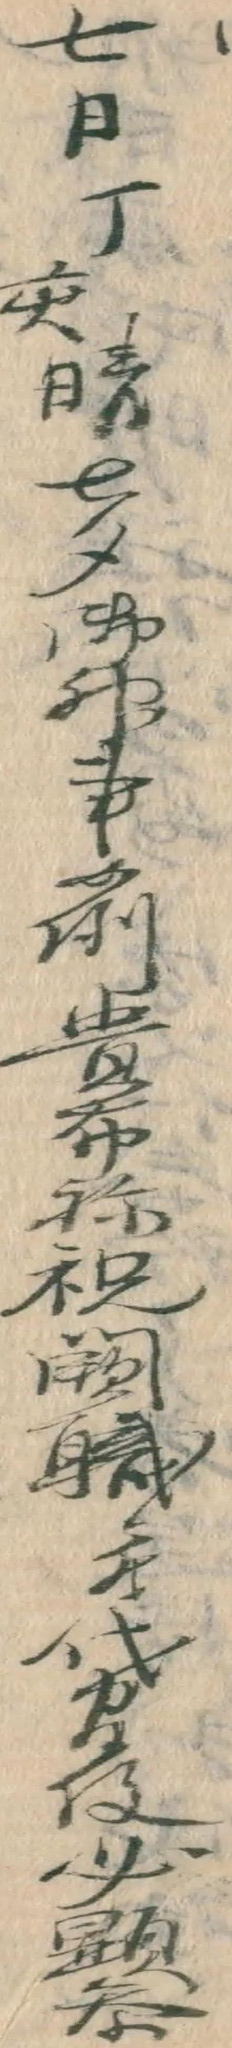七日丁亥晴七夕御神事前貴布称祝闕職ニ付代官役必顕参
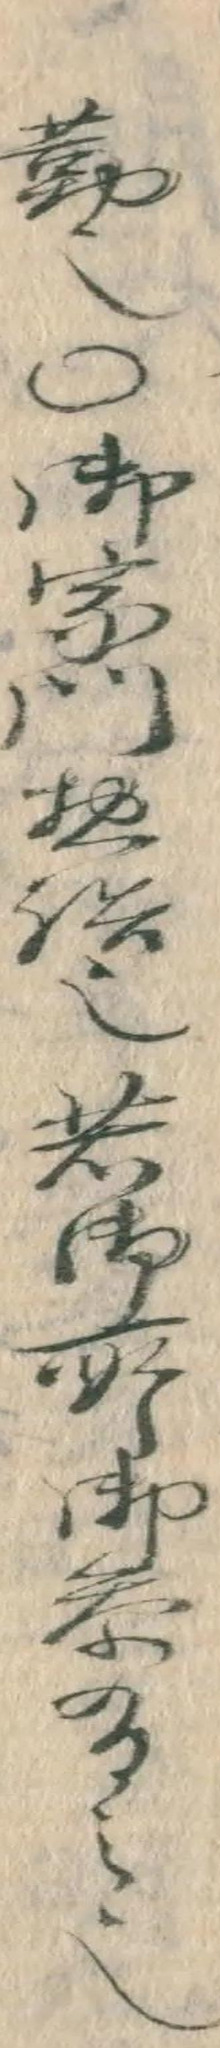勤也○御家門惣詰也若御所御参有之也
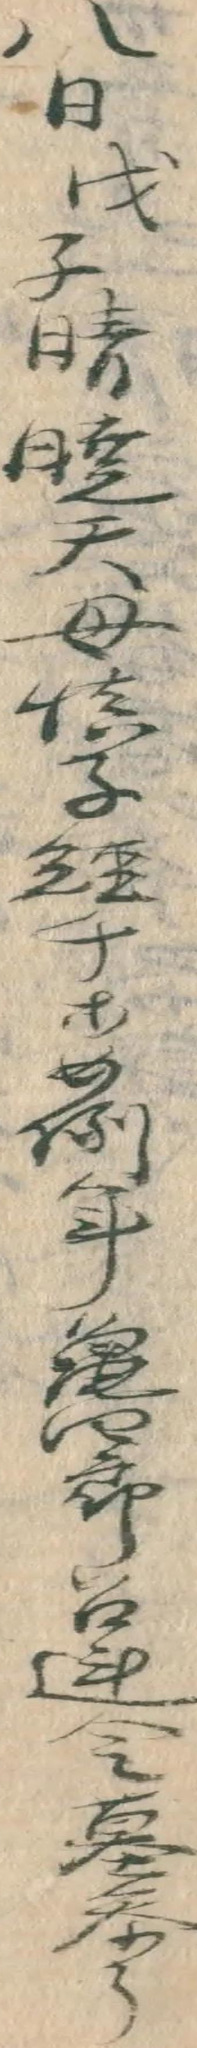八日戊子晴暁天母慎子経千等如例年亀四郎召連令墓参了
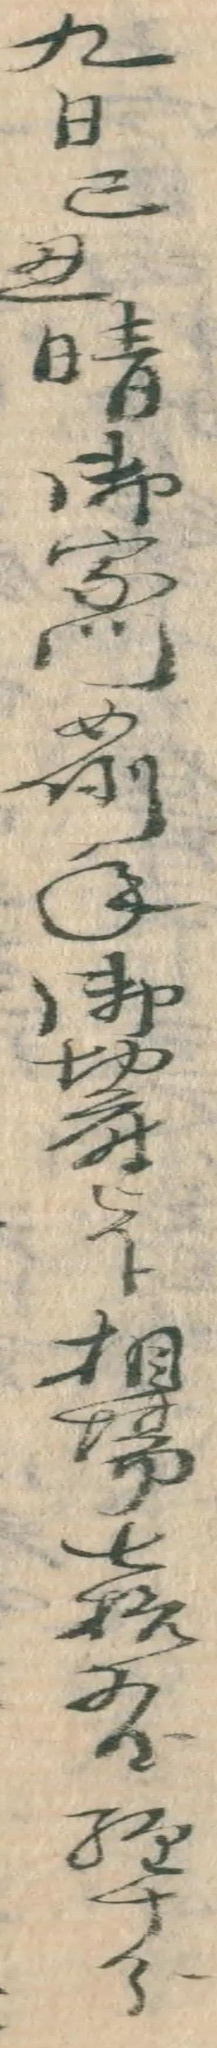九日己丑晴御家門如例年御切府被下相場七拾五匁経千分
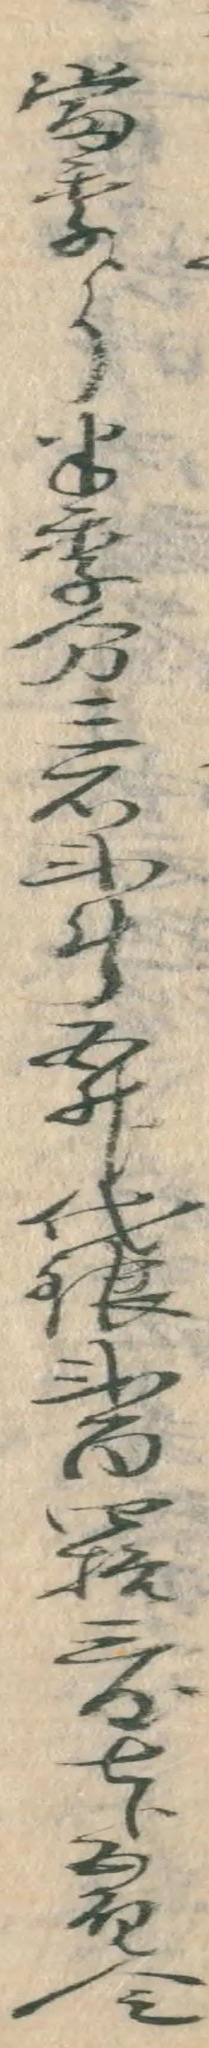當季より半季分三石弐升代銀弐百四拾三匁七分五厘全
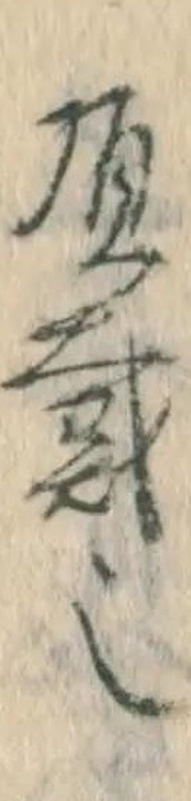頂戴之
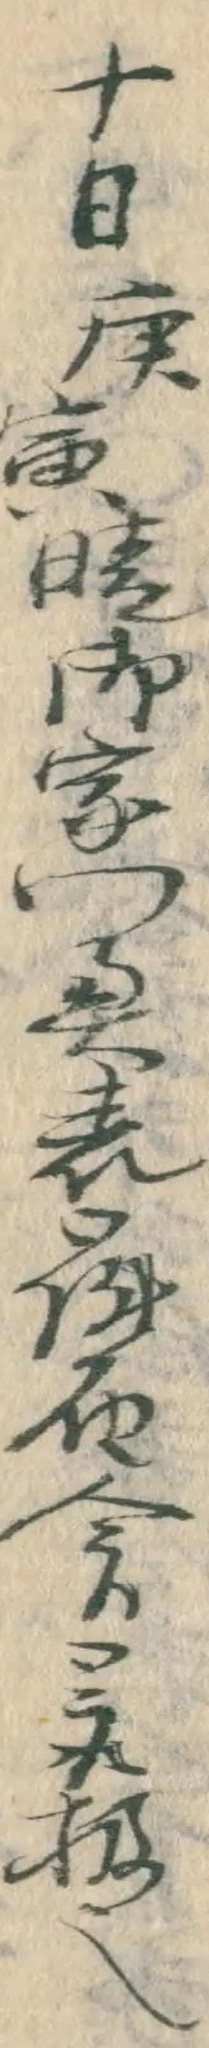十日庚寅晴御家門奥表御附届今日御取扱也
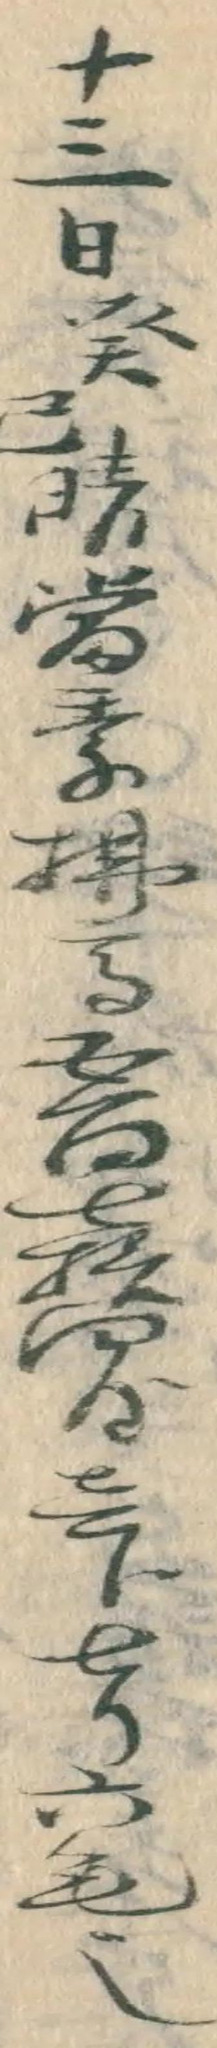十三日癸巳晴當季払高五百七拾四匁壱分七り六毛也
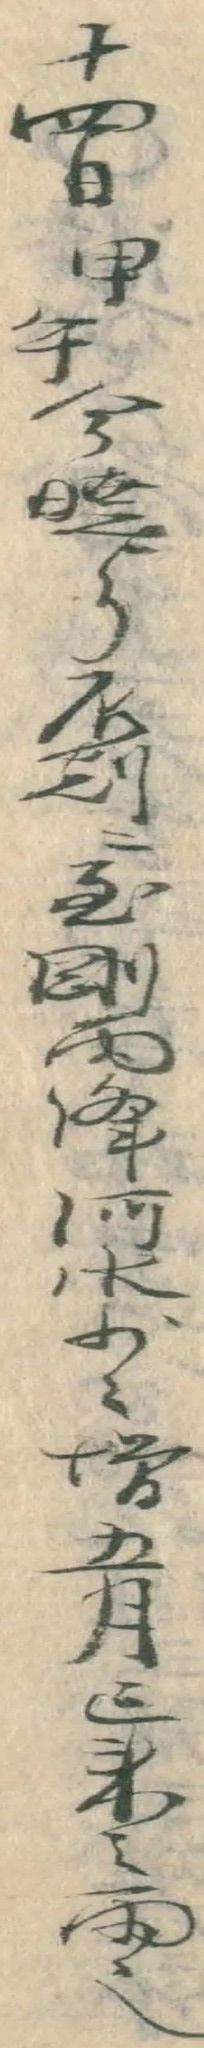十四日甲午今暁より辰刻に至剛雨降河水少々増五月巳来之雨也

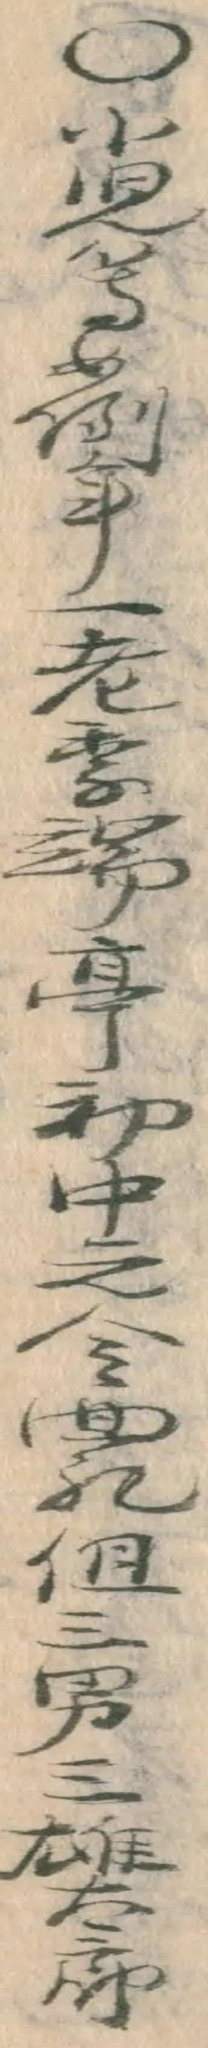〇小児等如例斗一老季端亭初中元令回礼但三男三雄太郎
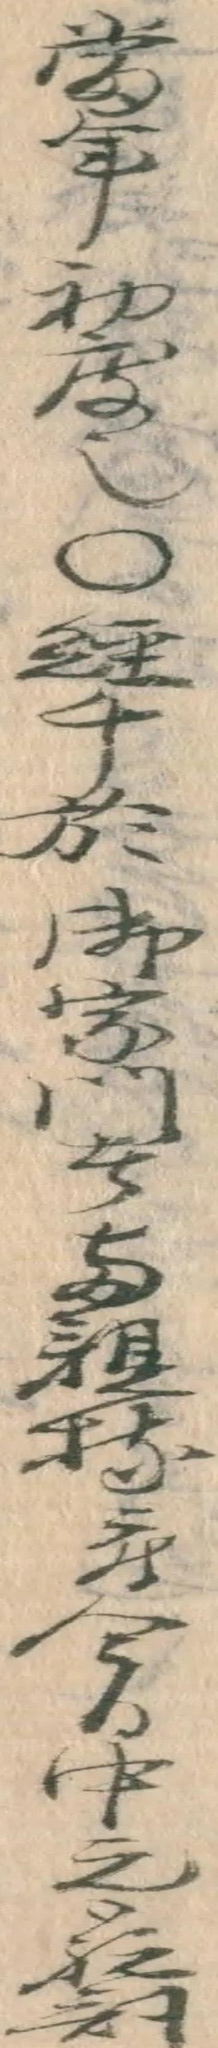當年初度也○経千於御家門其両親持ニ付今日中元御祝詞
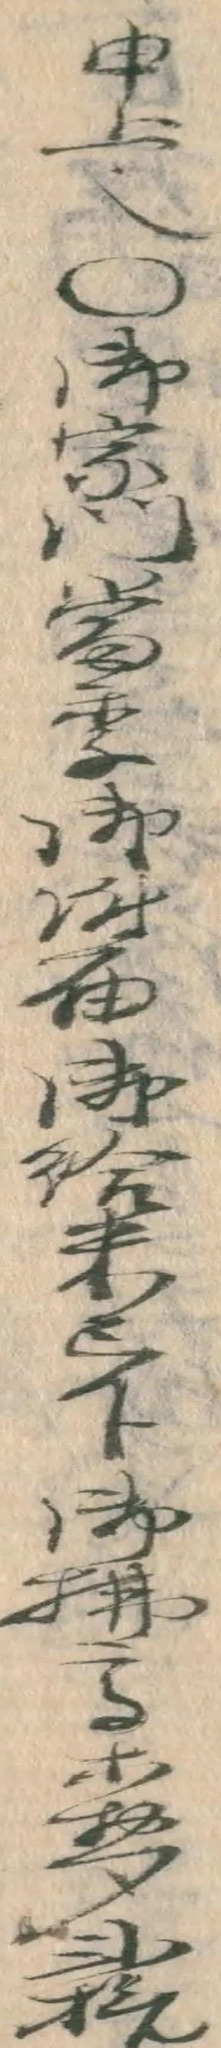申上也○御家門當季御附届御給米已下御払高等惣〆弐拾
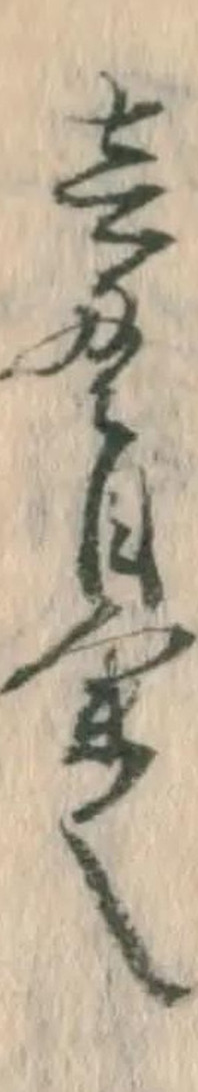壱貫目余也
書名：賀茂社記録. 第65冊
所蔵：国立国会図書館 National Diet Library, JAPAN
